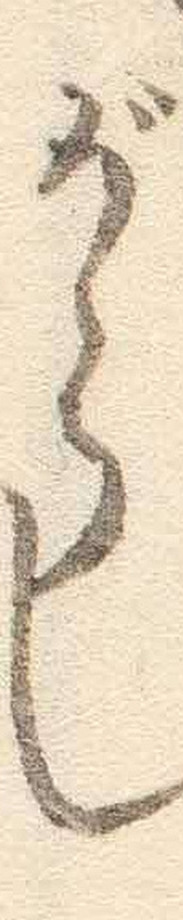がらし
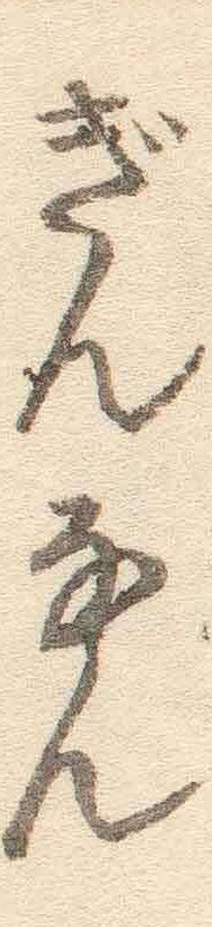ぎんあん

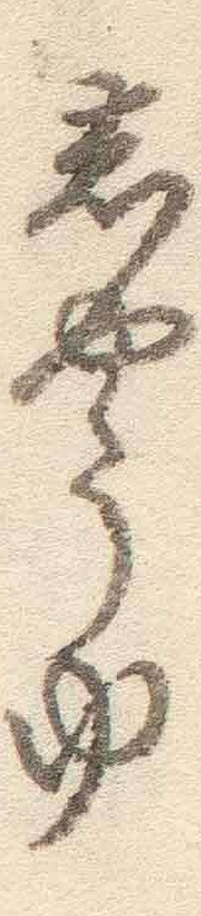しやうゆ
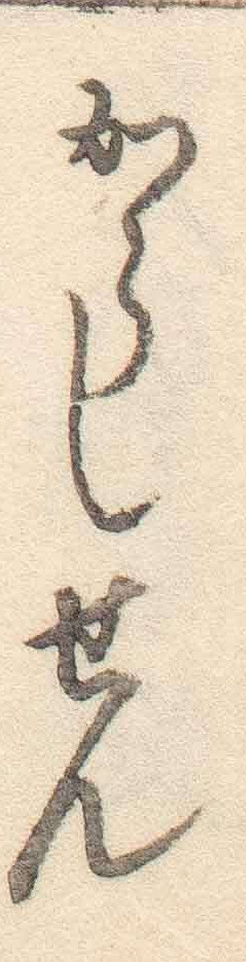からしせん
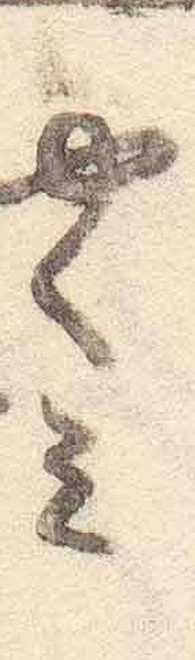やくみ
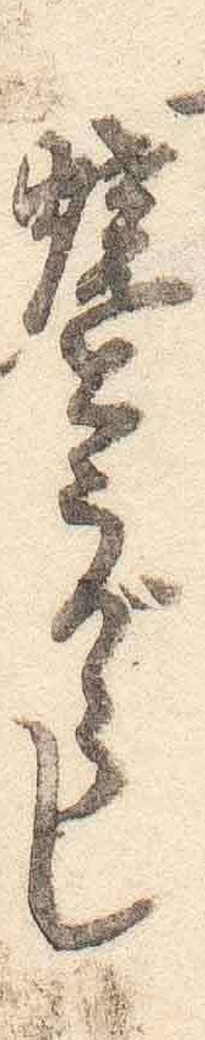焼とうがらし
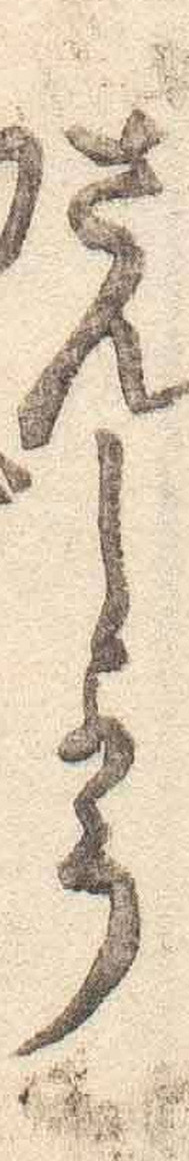さんしよう
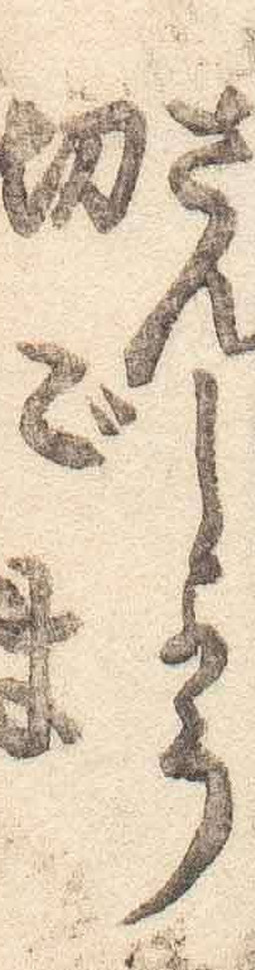切ごま
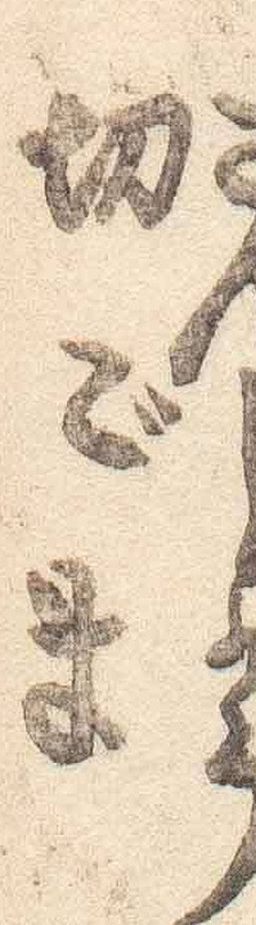切ごま
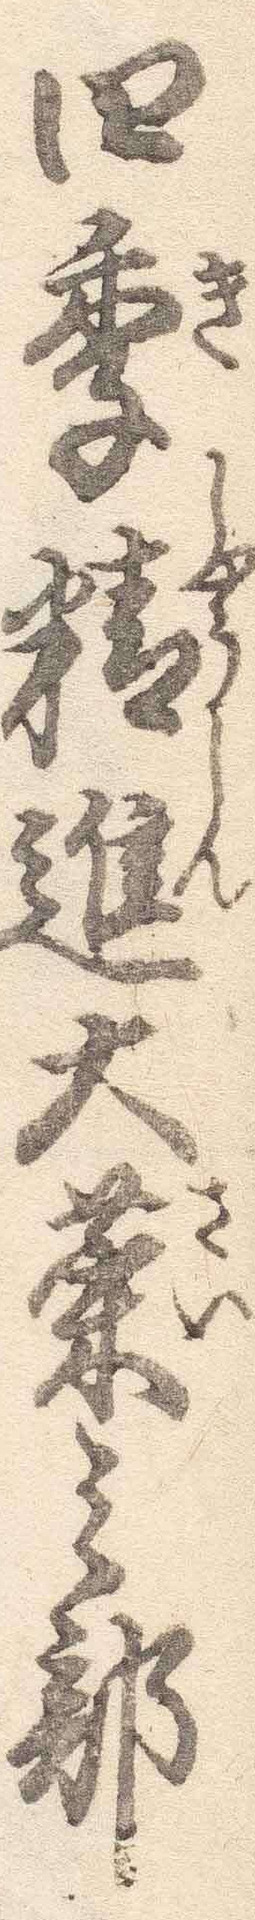四季精進大菜之部
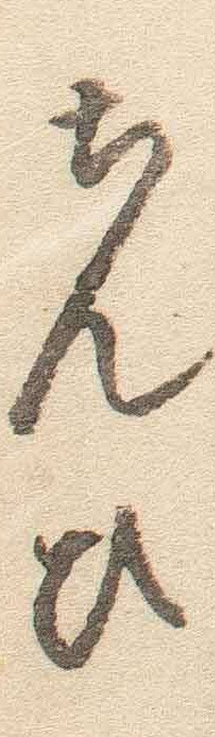ちんひ

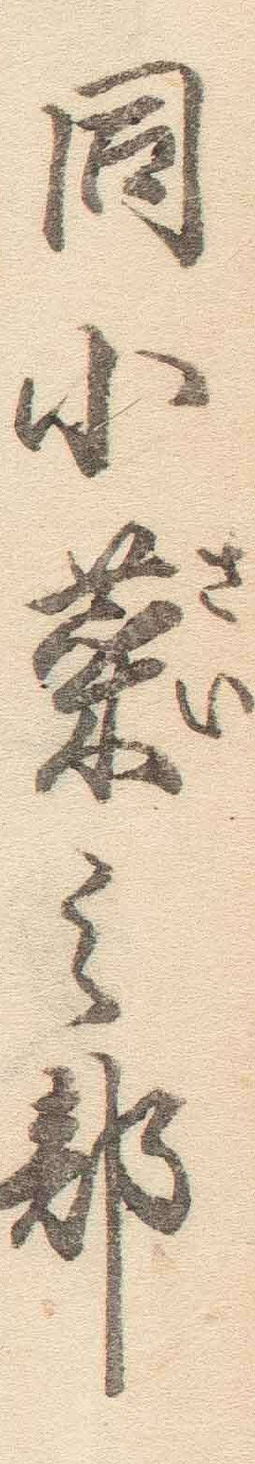同小菜之部
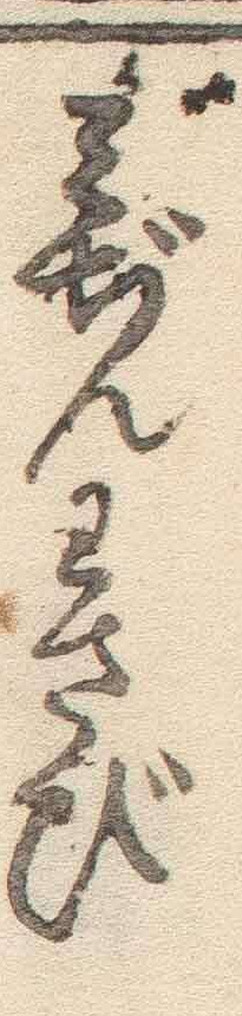ぢくわさび
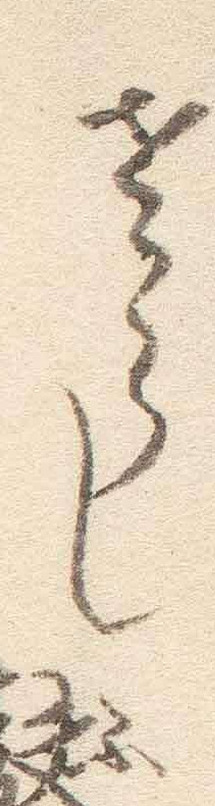さらし麩
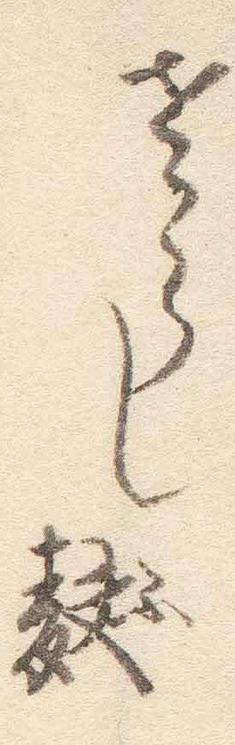さらし麩
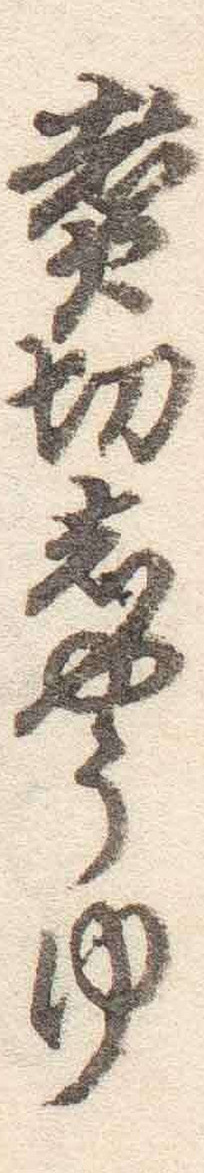煮切しやうゆ
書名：料理通
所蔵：東京学芸大学附属図書館 国文学研究資料館
